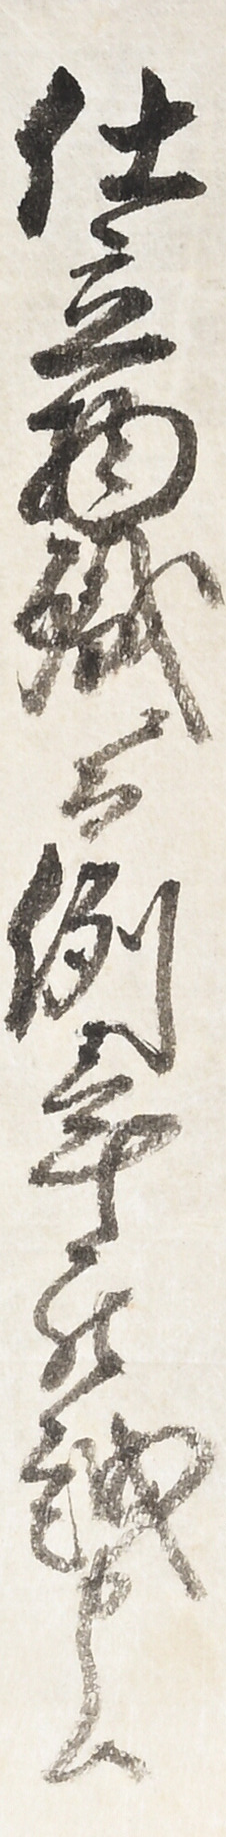仕立職ニ而例年罷越申候
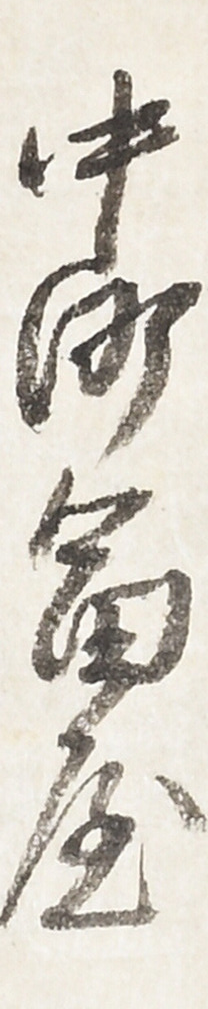中町冨屋
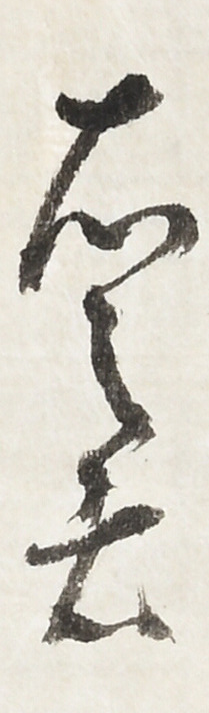右之者
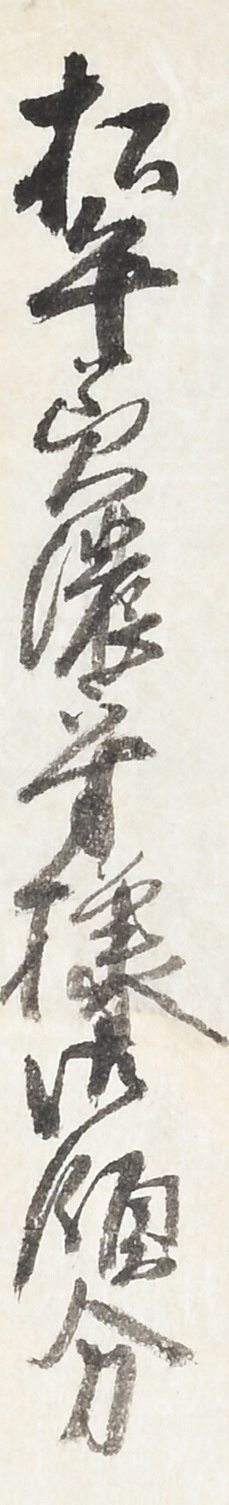松平美濃守様御領分
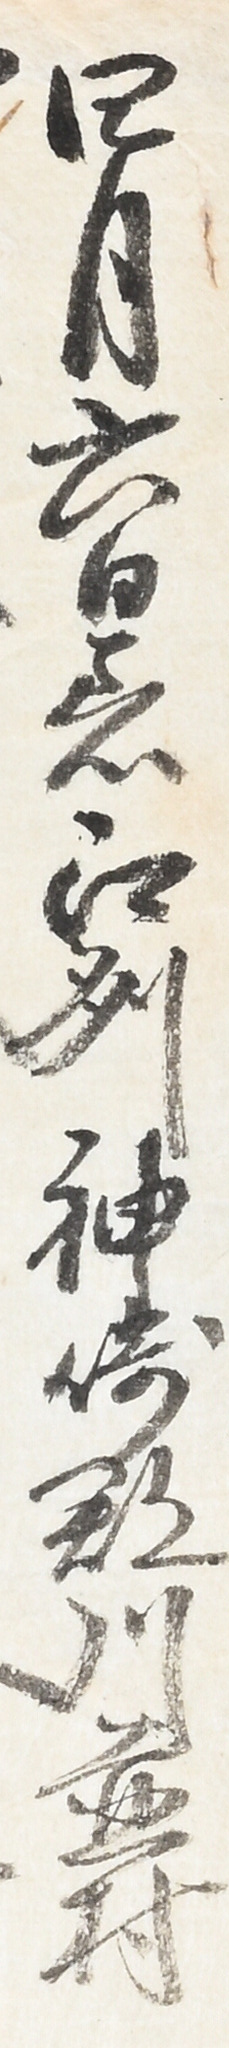四月六日着江州神崎郡川並村
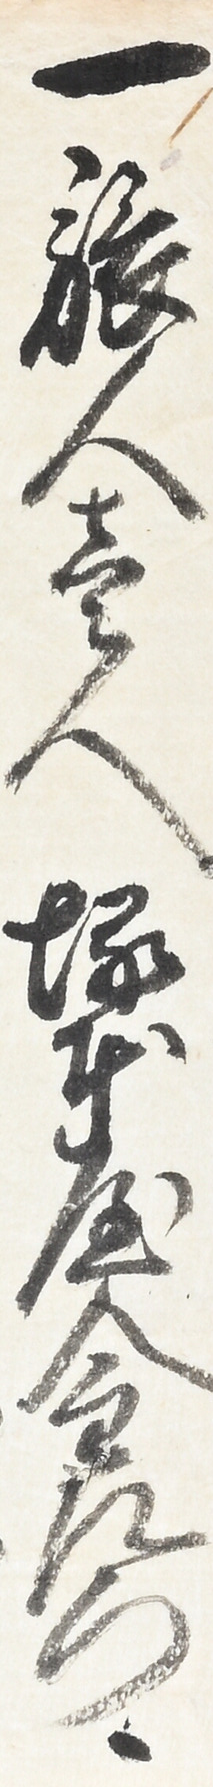一旅人壱人塚本屋金左衛門・
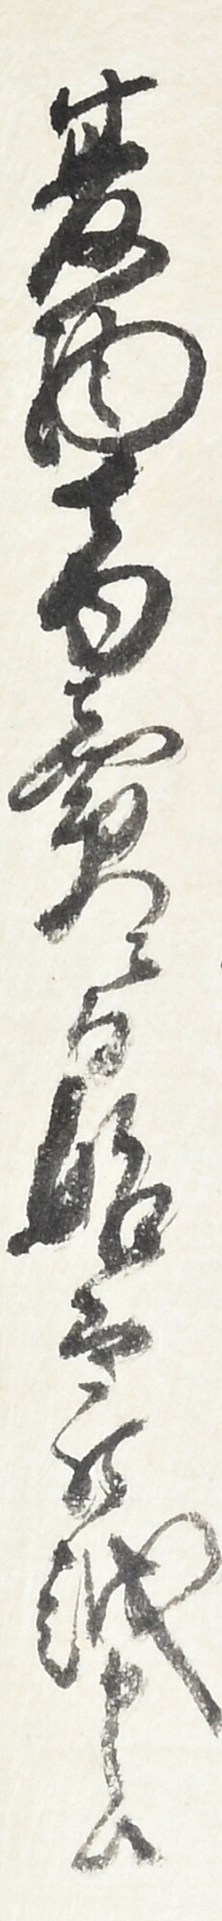夏物商売ニ而始而罷越申候
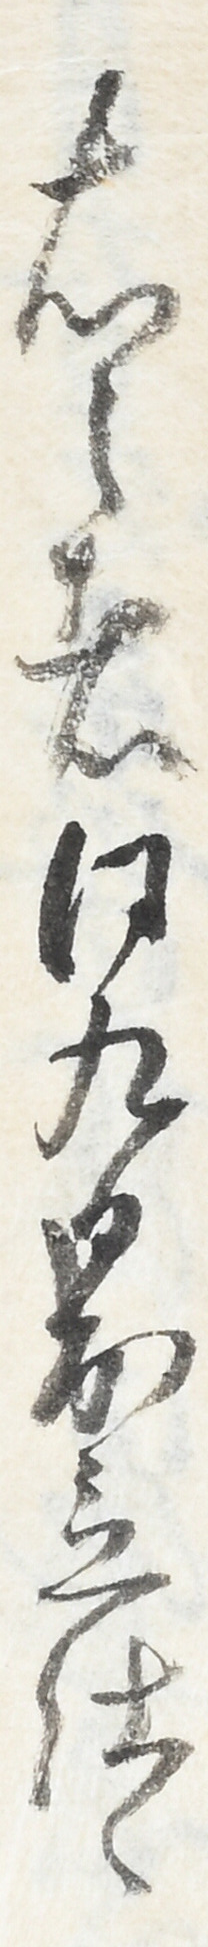右之者同九日出立仕候

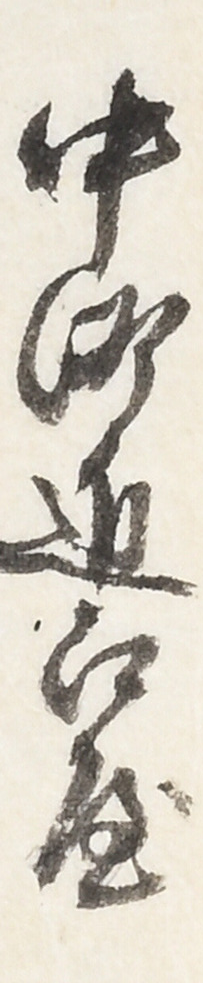中町近江屋
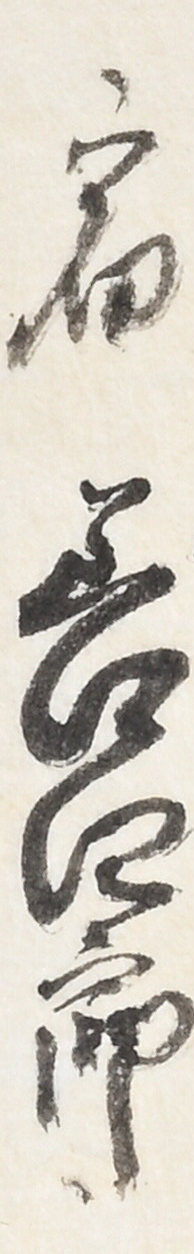宿善四郎
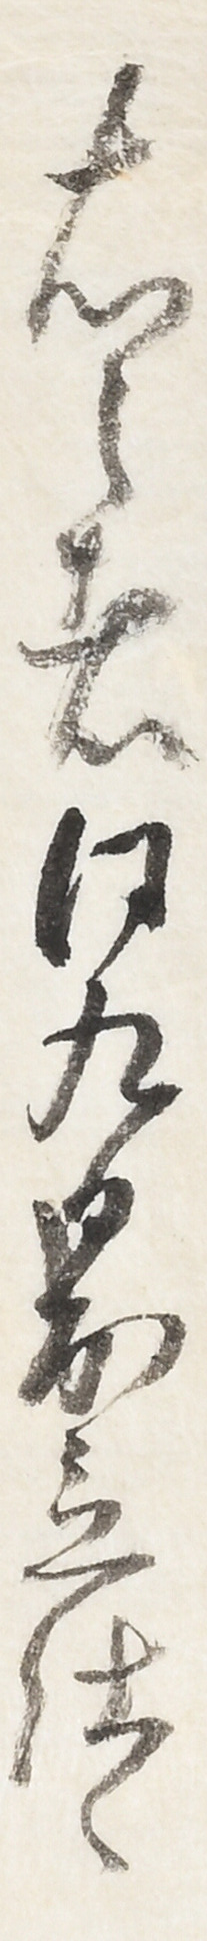右之者同九日出立仕候
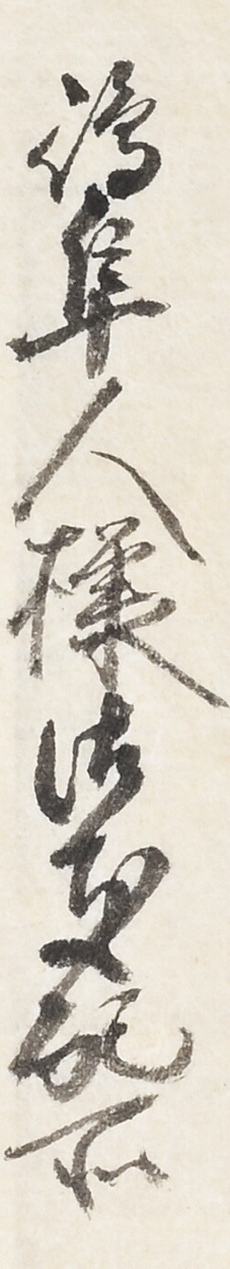嶋隼人様御支配所
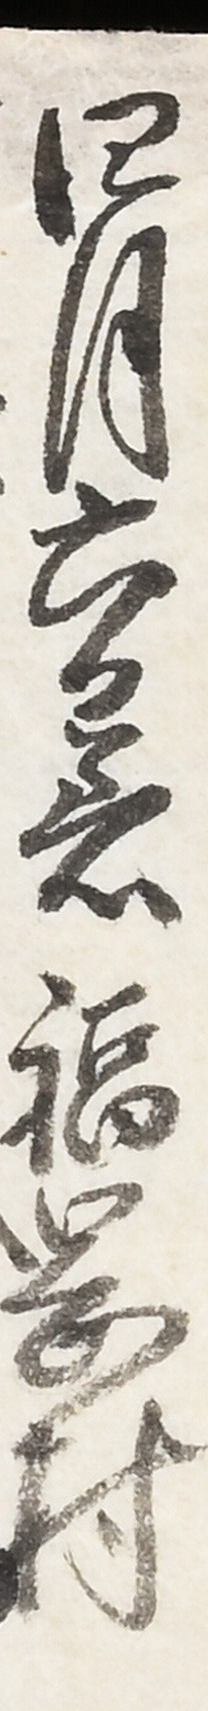四月六日着福岡村
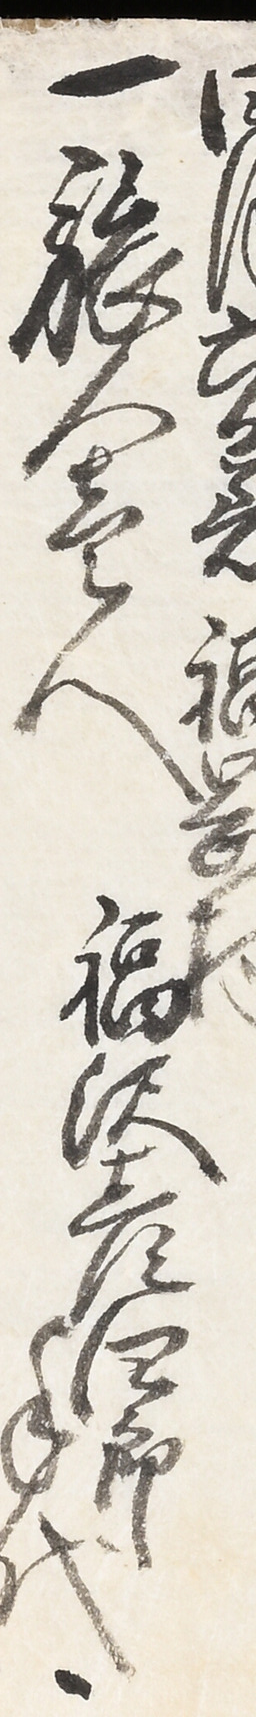一旅人壱人福沢彦四郎
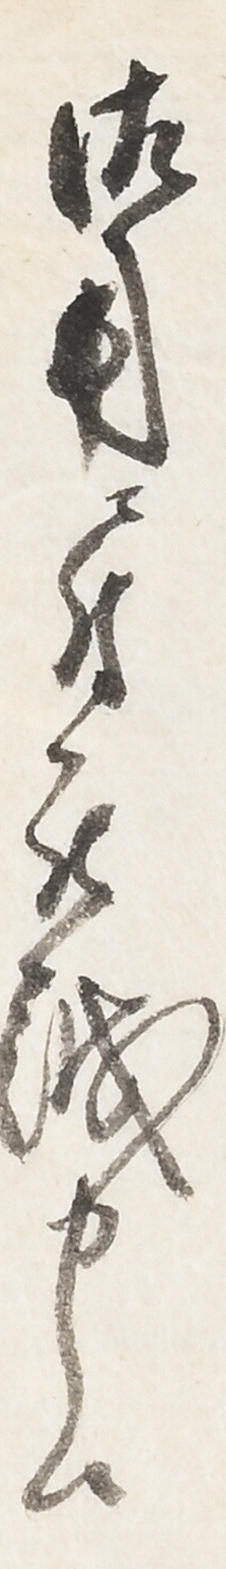御用ニ付罷越申候
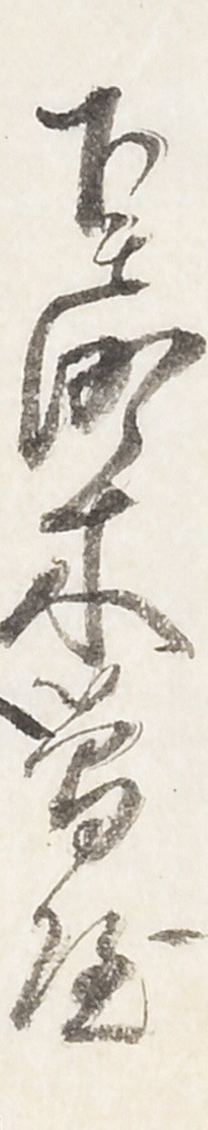下モ町木曽屋
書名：旅人泊控帳
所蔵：伊那市立高遠町図書館・合同会社AMANE
